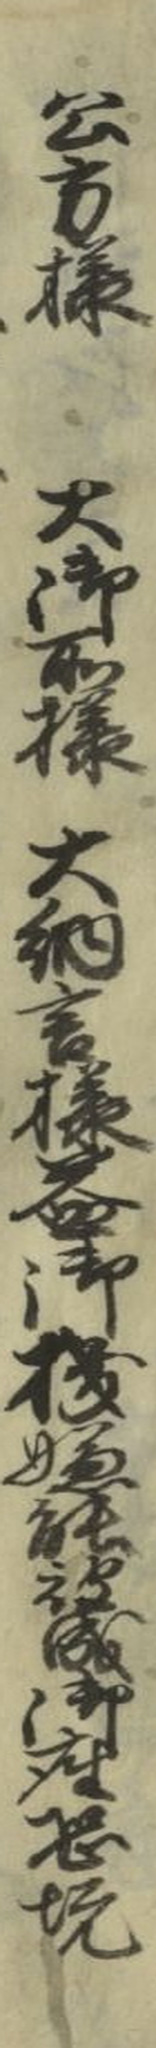公方様大御所様大納言様益御機嫌能被成御座恐悦
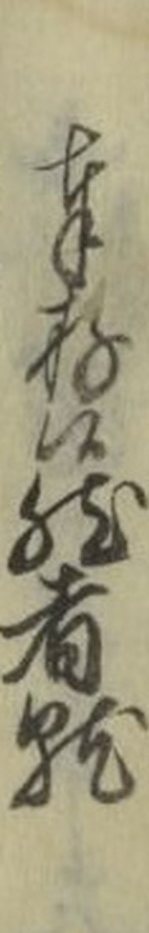奉存候然者就
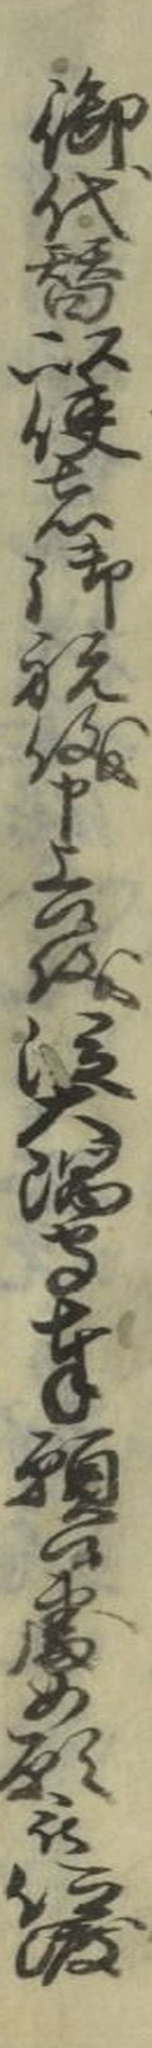御代替以使者御祝儀申上候儀従大隅守奉願候處如願被仰渡
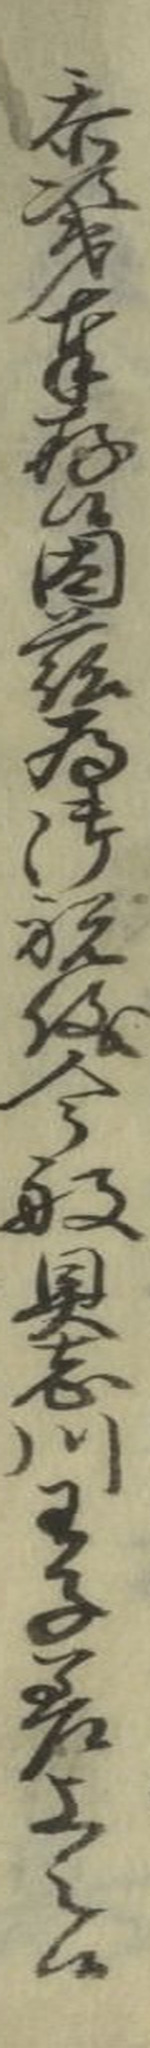忝次第奉存候因茲為御祝儀今般具志川皇子差上之候
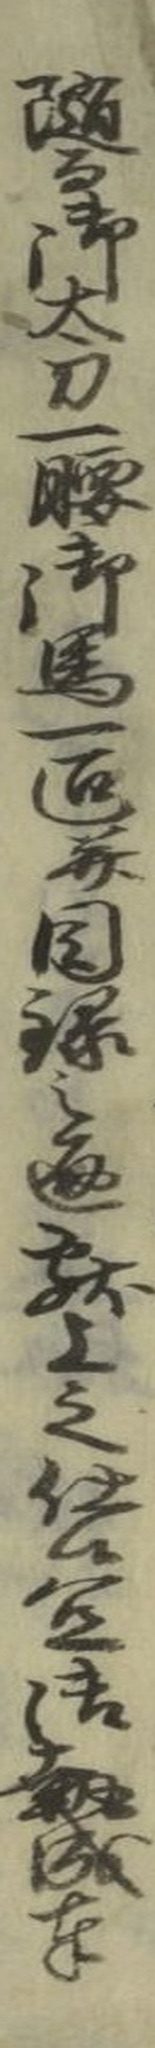随而御太刀一腰御馬一疋幷目録之通献上之仕候宜御執成奉
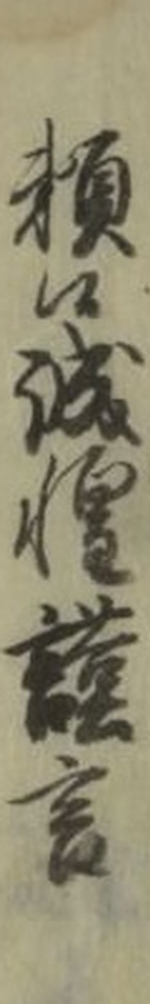頼候誠惶謹言
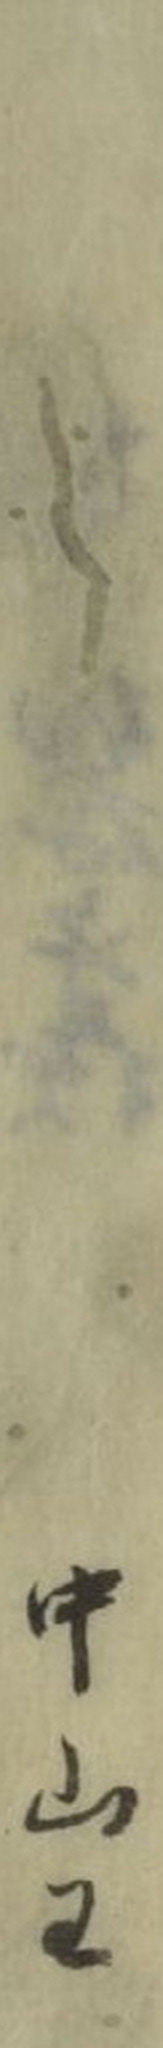中山王
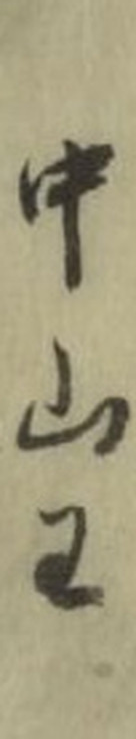中山王
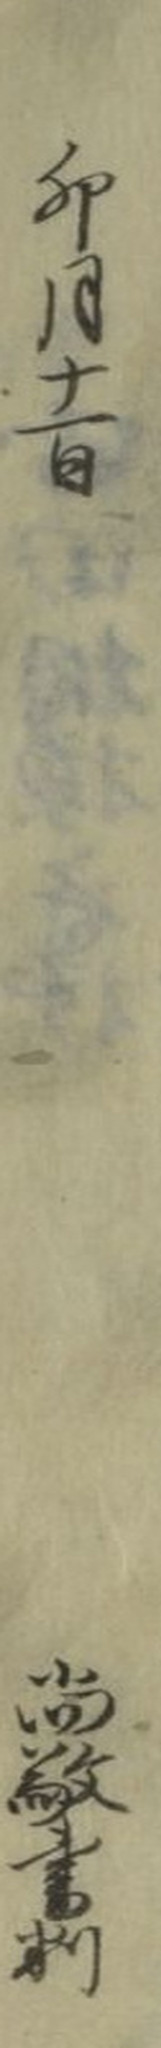卯月十一日尚敬書判

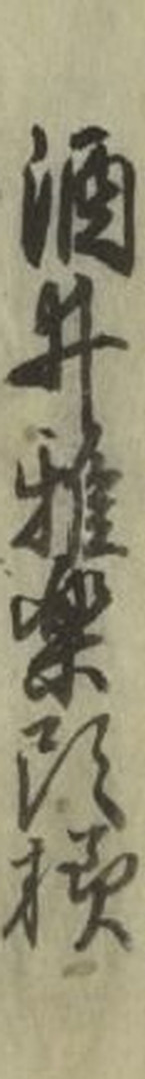酒井雅楽頭様
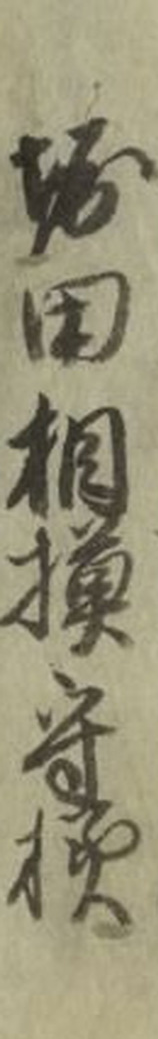堀田相模守様
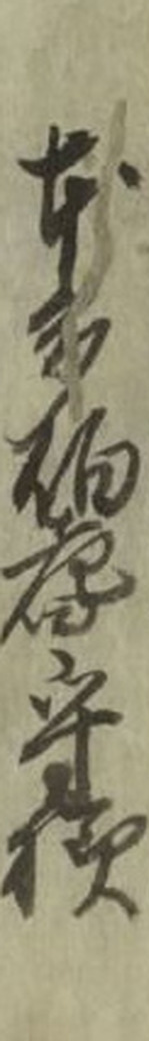本多伯耆守様
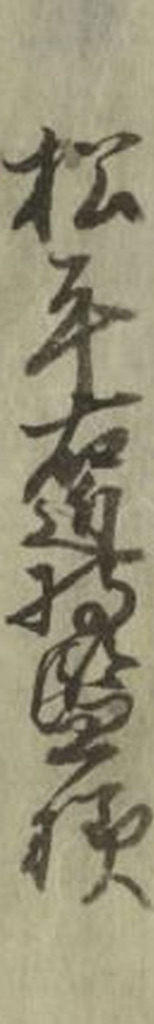松平右近将監様
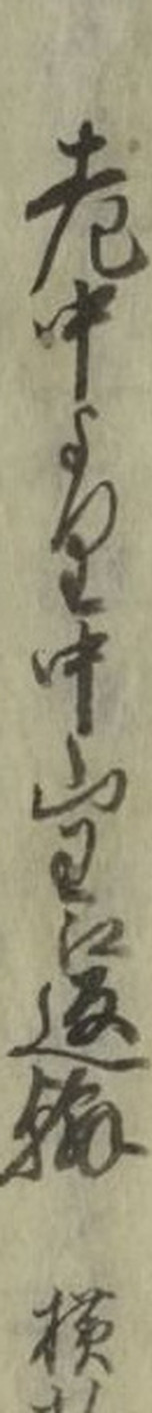老中より中山王え返翰横折
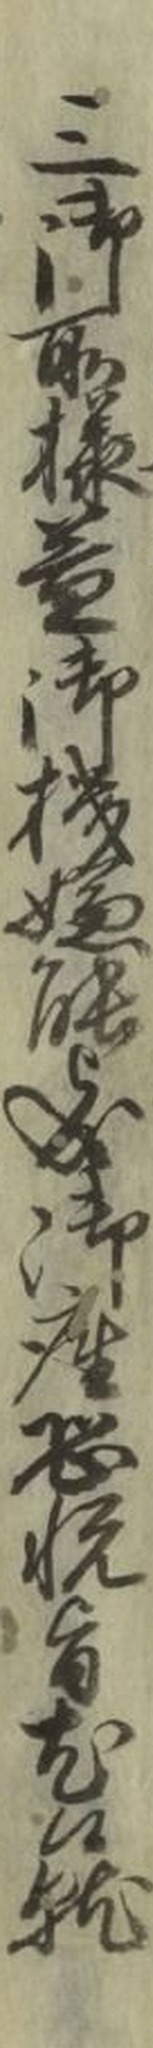三御所様益御機嫌能披成御座恐悦旨尤候就
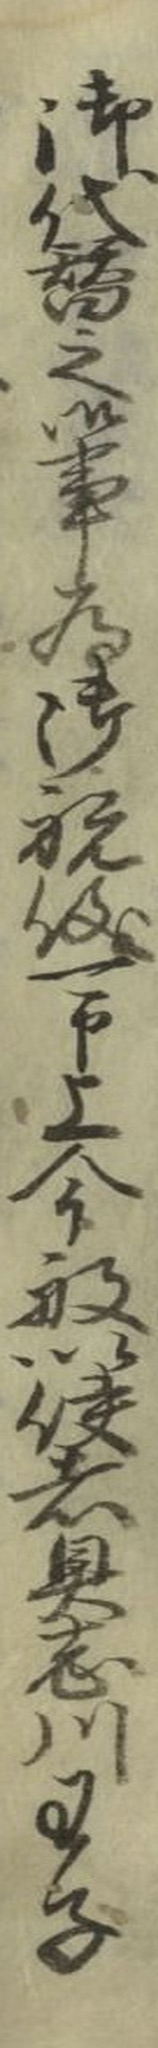御代替之御事為御祝儀可申上今般以使者具志川皇子
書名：琉球人来朝之記
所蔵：University of the Ryukyus Library
